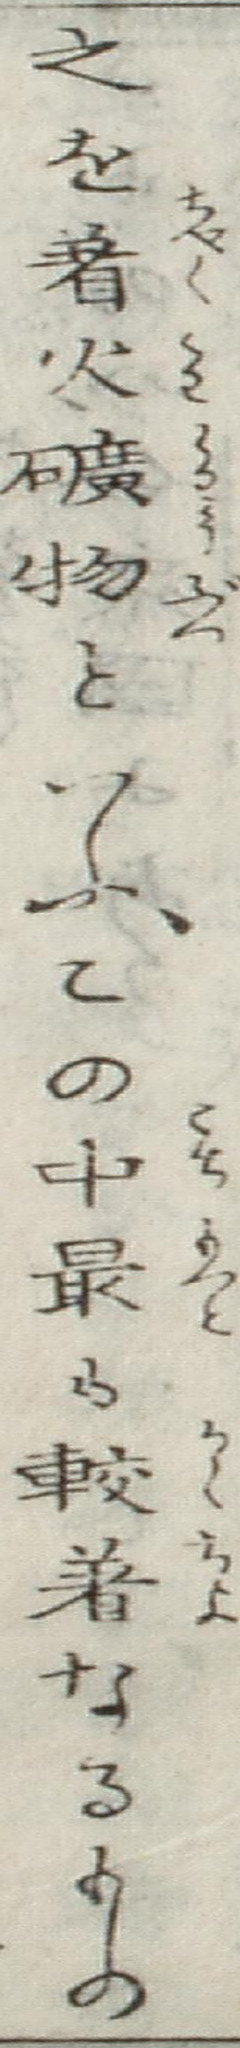之を着火砿物といふ、この中最も較著なるもの
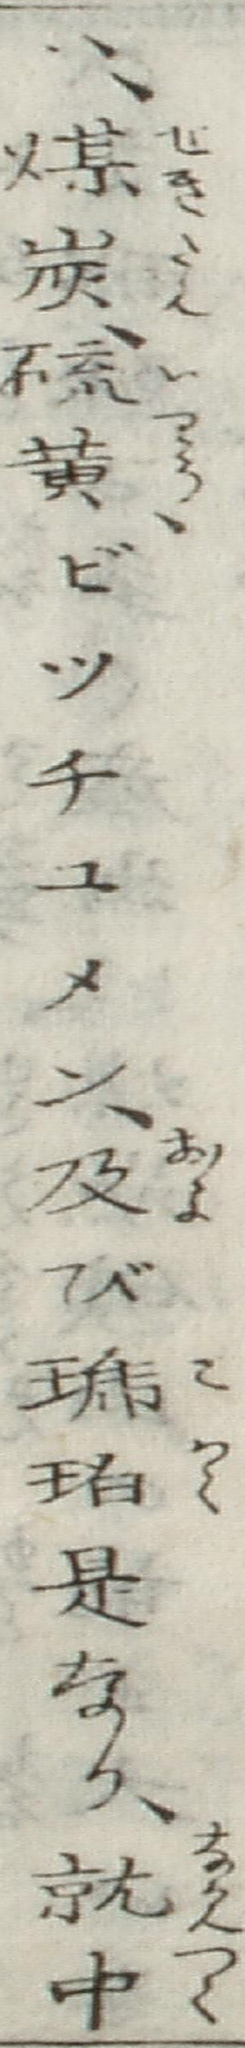は、煤炭、硫黄、ビツチユメン、及び琥珀是なり、就中
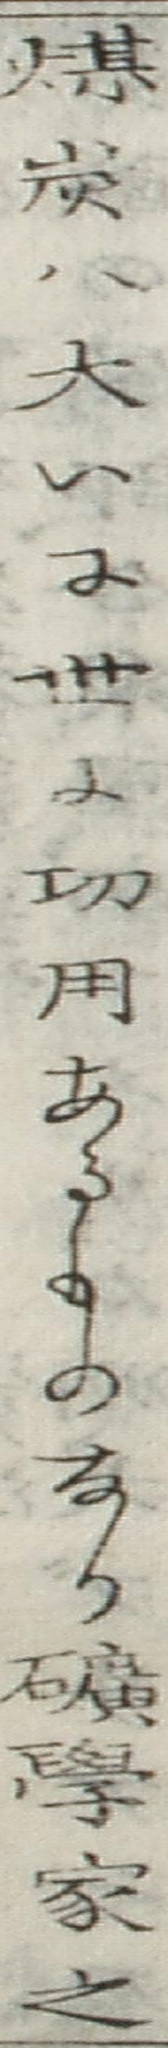煤炭は大いに世に功用あるものなり砿学家之
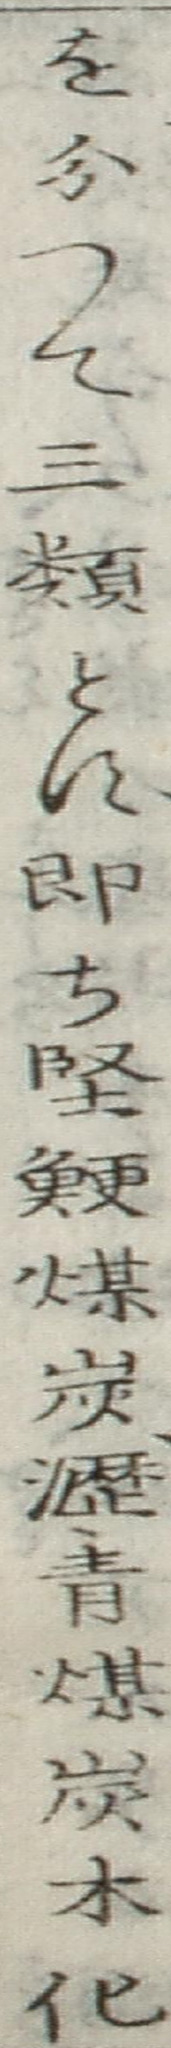を分つて三類とす、即ち堅硬煤炭、瀝青煤炭木化

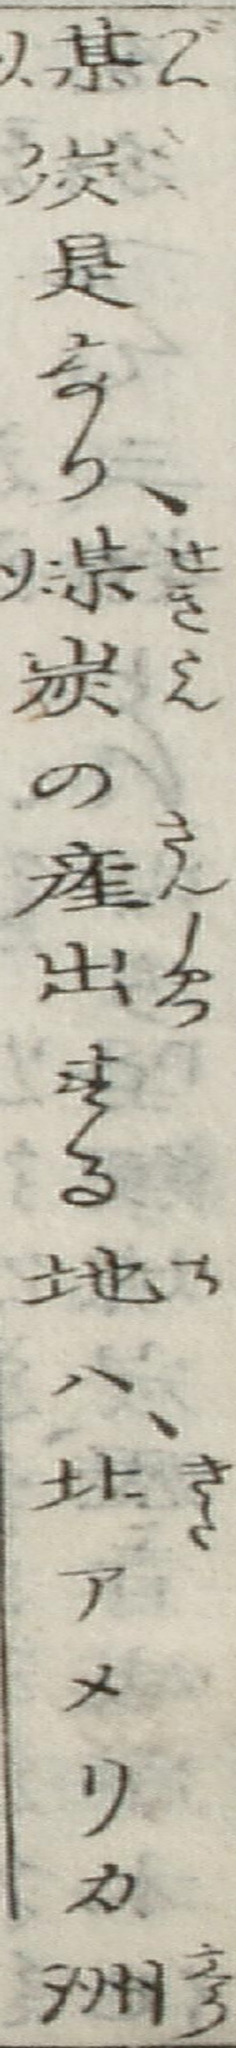煤炭是なり、煤炭の産出する地は、北アメリカ洲
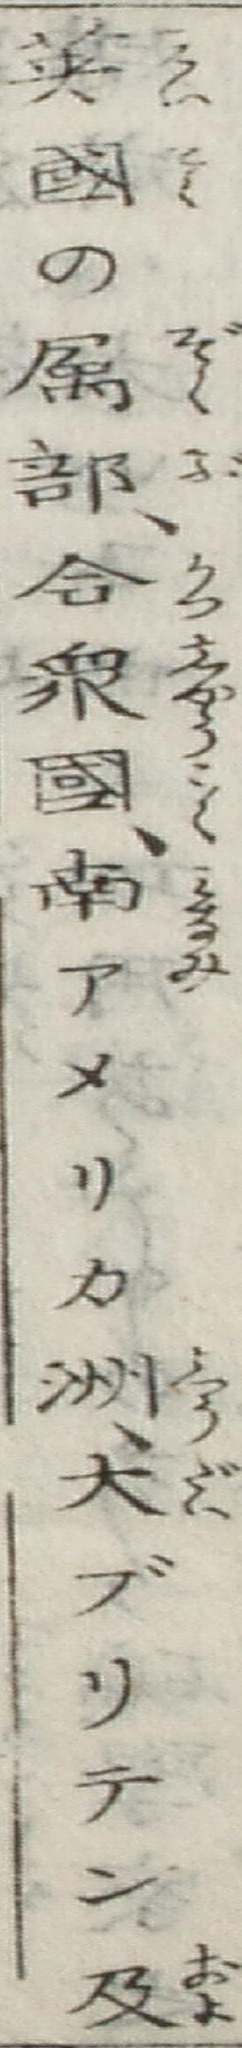英国の属部、合衆国、南アメリカ洲、大ブリテン及
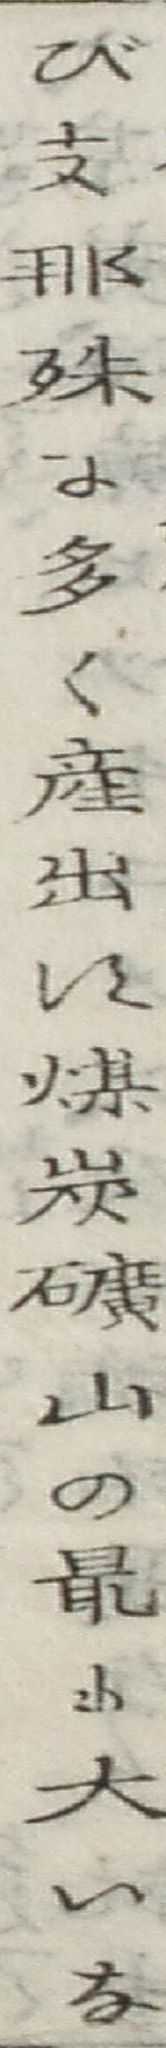び支那殊に多く産出す、煤炭砿山の最も大いな
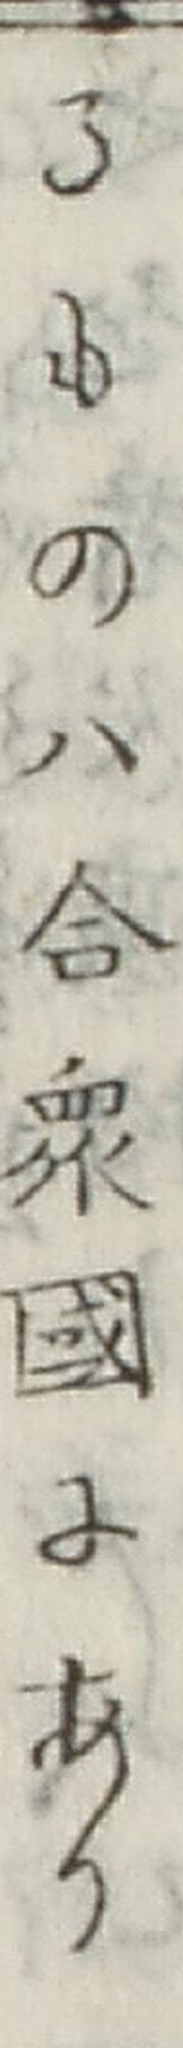るものは合衆国にあり
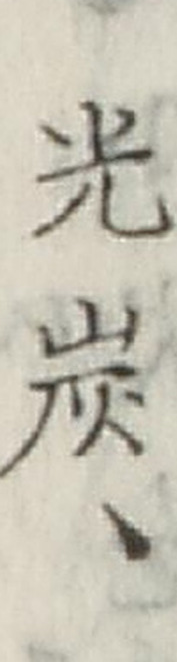光炭、
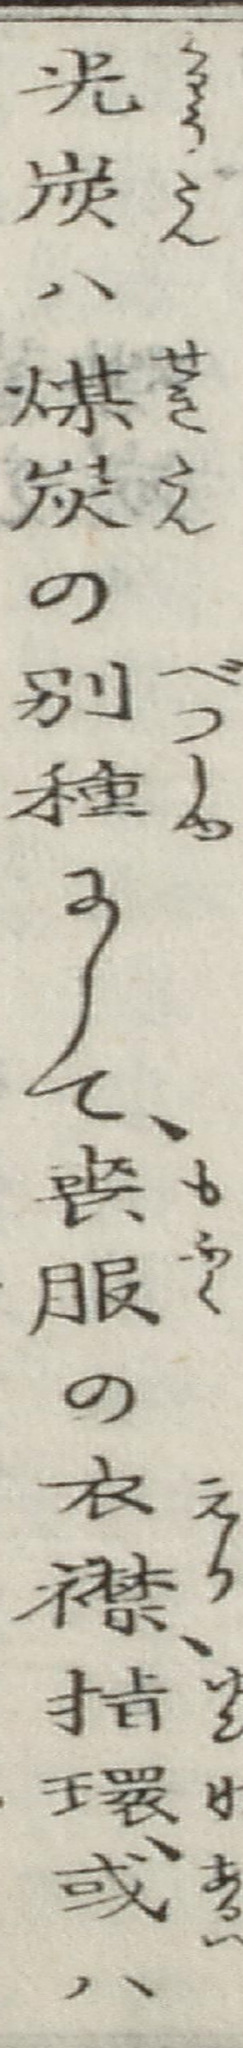光炭は煤炭の別種にして、喪服の衣襟、指輪、或は
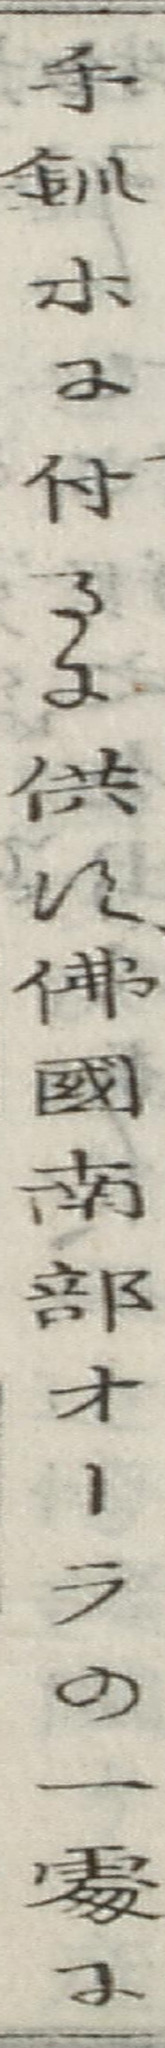手釧等に付るに供す、仏国南部オーラの一処に
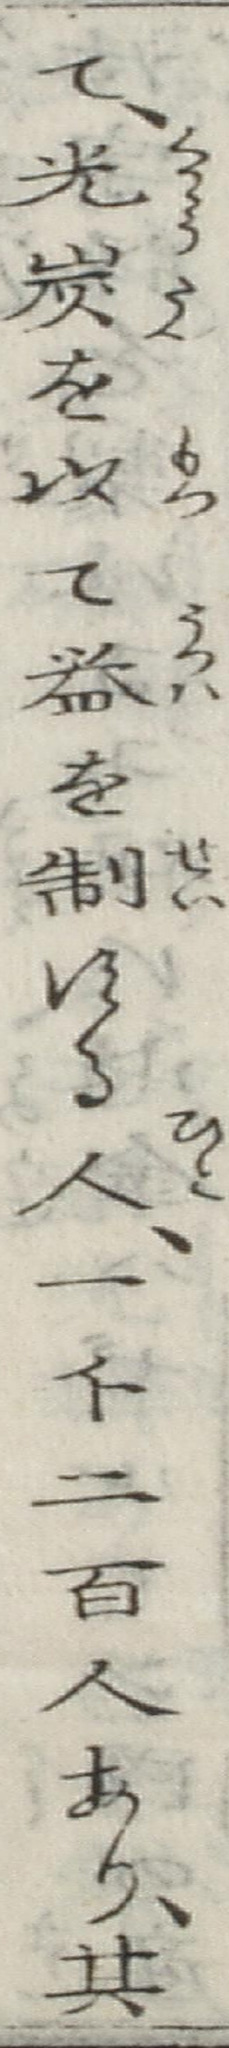て、光炭を以て器を制する人、一千二百人あり、共
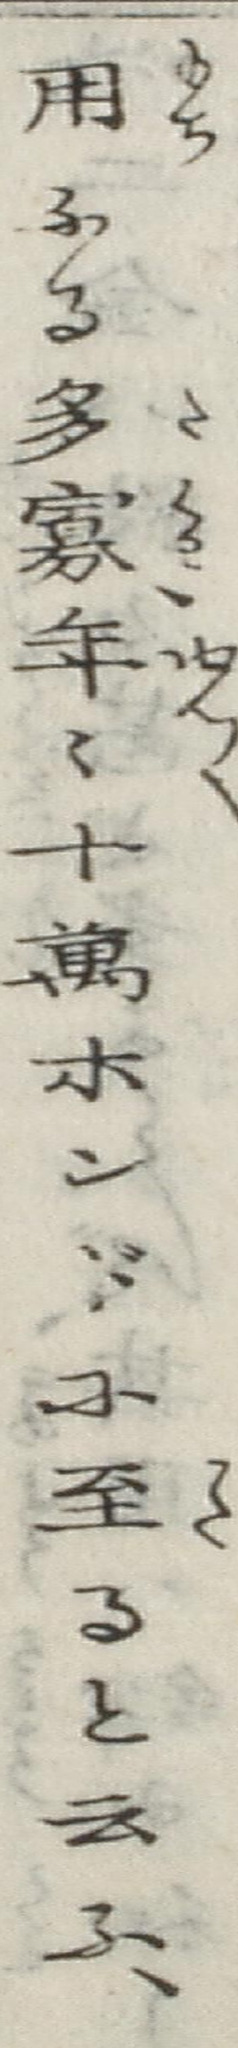用ふる多寡、年〻十万ホンドに至ると云ふ、
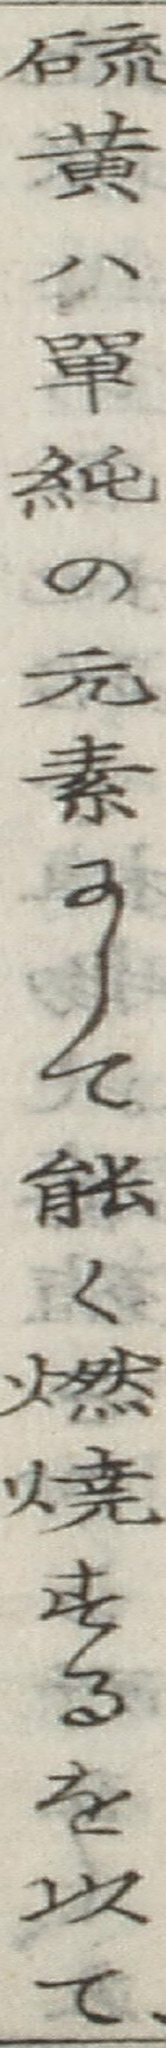硫黄は単純の元素にして、能く燃焼するを以て、
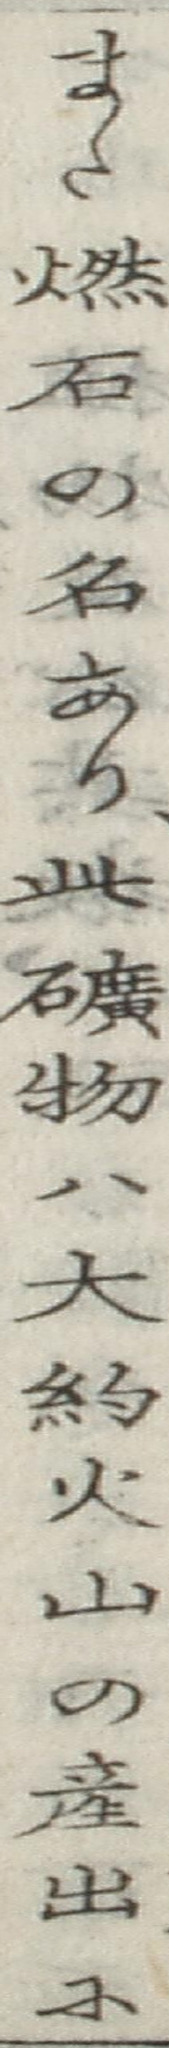また燃石の名あり、此砿物は大約火山の産出に
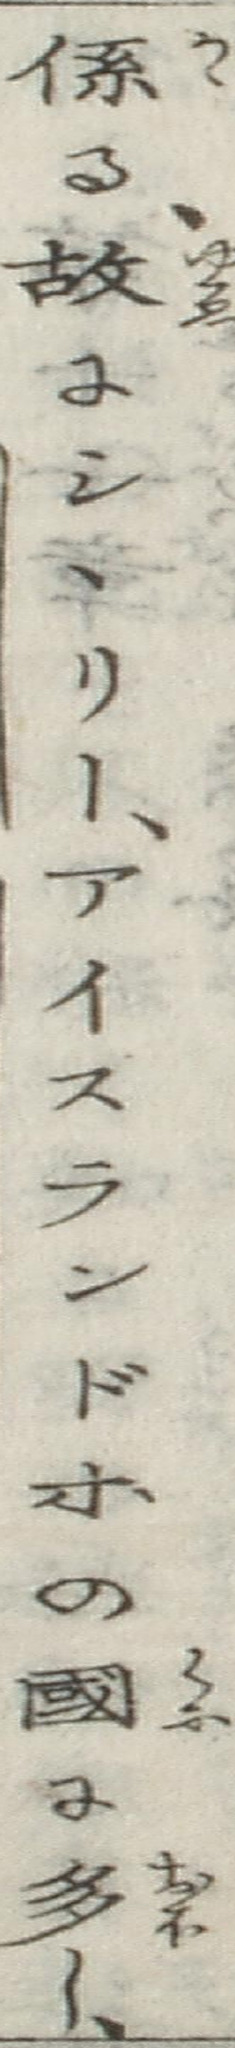係る、故にシヽリー、アイスランド等の国に多し、
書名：訓蒙　天然地理學　下
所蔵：東京大学地震研究所図書室 Earthquake Research Institute Library, The University of Tokyo, JAPAN
